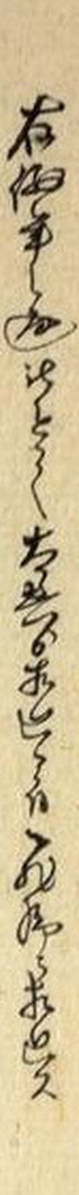右例年之通被進之大奥ゟ相廻候ニ付飛脚ニ相廻ス
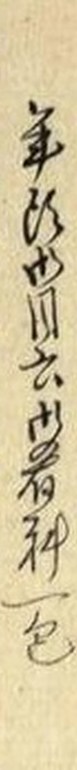年頭御目六御肴料一包
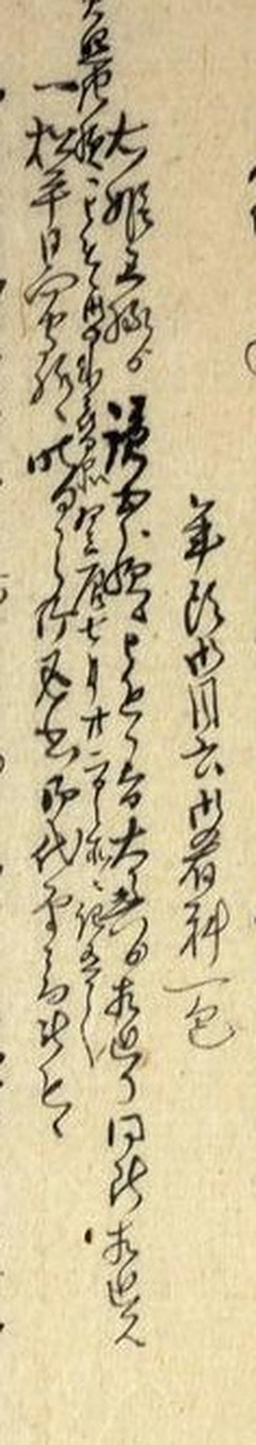右姫君様ゟ謙五郎様へ被進候旨大奥ゟ相廻り同断相廻ス
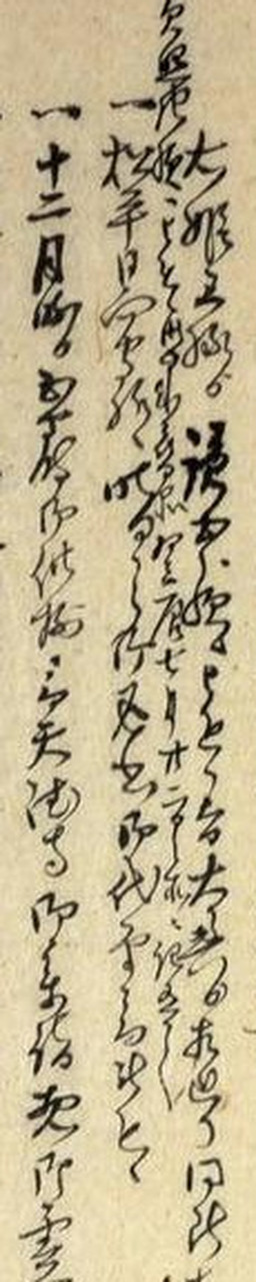一松平日向守様へ昨日之御返書御代筆ニ而被進候
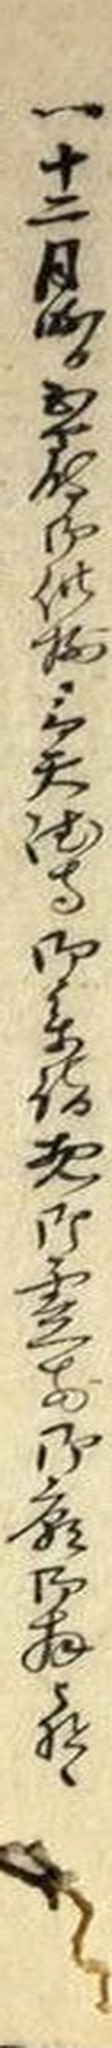一十二月晦日五半時御供揃ニ而天徳寺御参詣惣御霊前御廟御拝被遊候
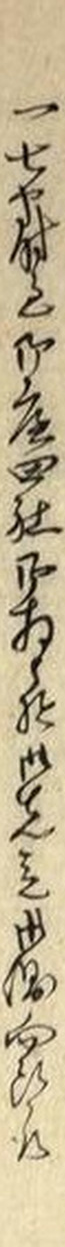一七半時過御庭四社御拝被遊御先立御側向頭取
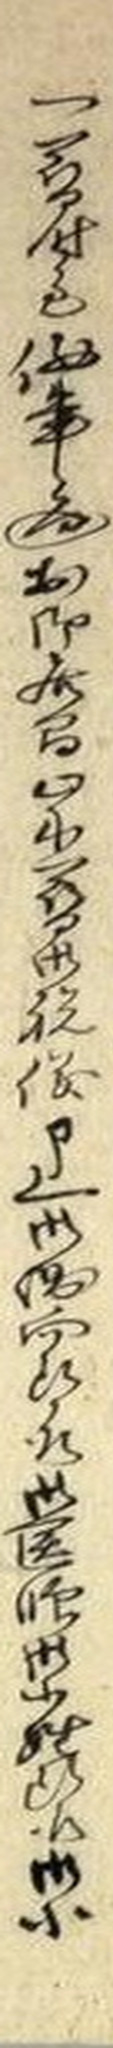一暮時過例年之通於御居間歳暮御祝儀申上御側向頭取御医師御小姓頭取御小
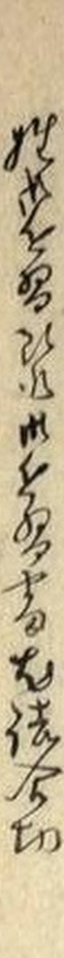姓御近習頭取御近習番尤詰合切
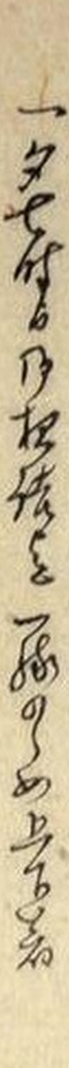一夕七時ゟ御夜詰迄一統のしめ上下着
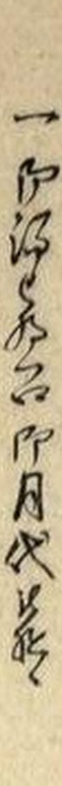一御湯被為召御月代被遊候
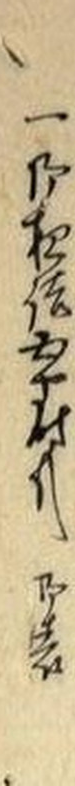一御夜詰五半時引御表

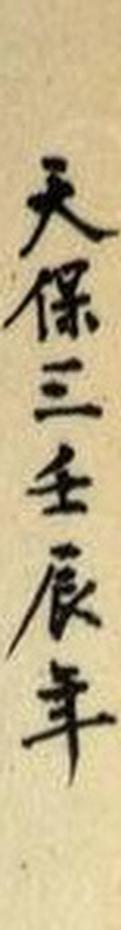天保三壬辰年

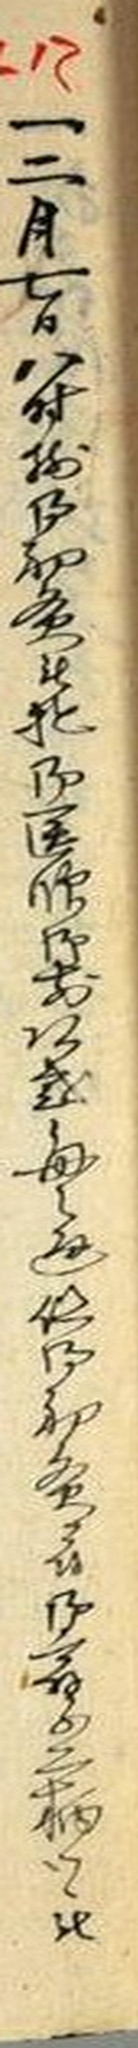一二月七日八時揃御初灸被遊御医師御前頂戴毎之通但御初灸ニ付御扇子二柄ツヽ被
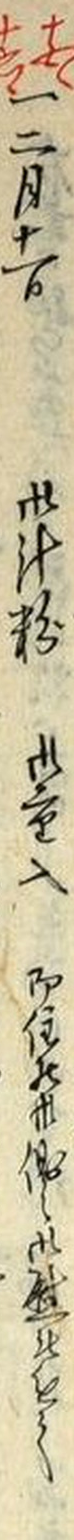一二月十一日御汁粉御重入御住居御側之御慰被進之
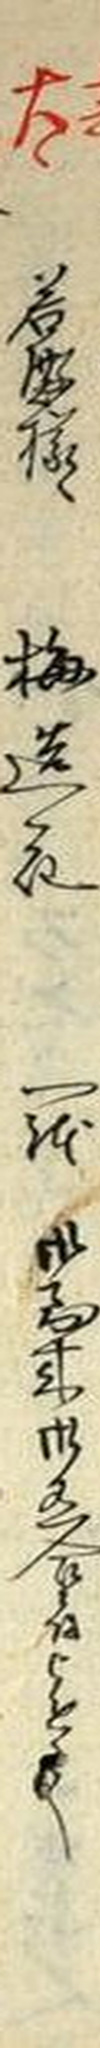若殿様へ梅造花一鉢御到来御有合ニ付被進之
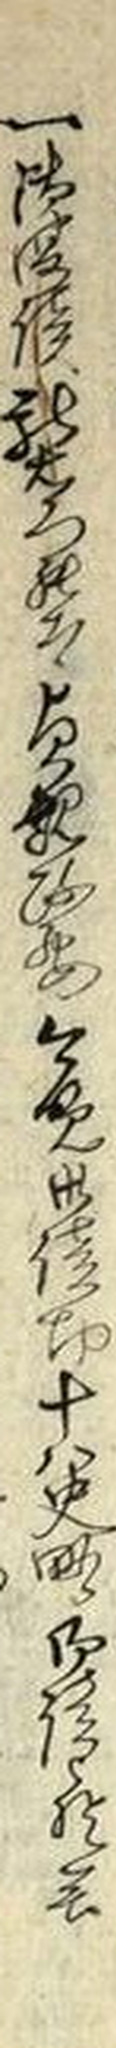一御復読新右衛門罷出候貞観政要今晩御読切十八史略御読被遊候筈
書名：少傅日録抄（斉承付側向頭取日記、在府）
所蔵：福井県文書館 Fukui Prefectural Archives
